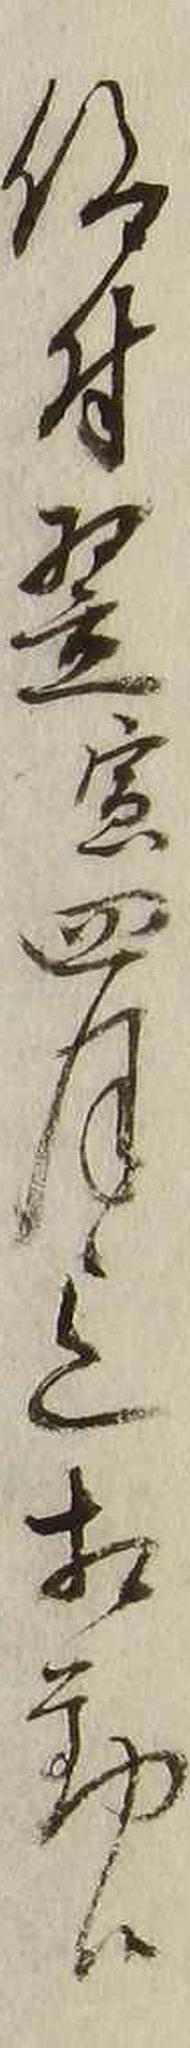仰付翌寅四月迄相勤候
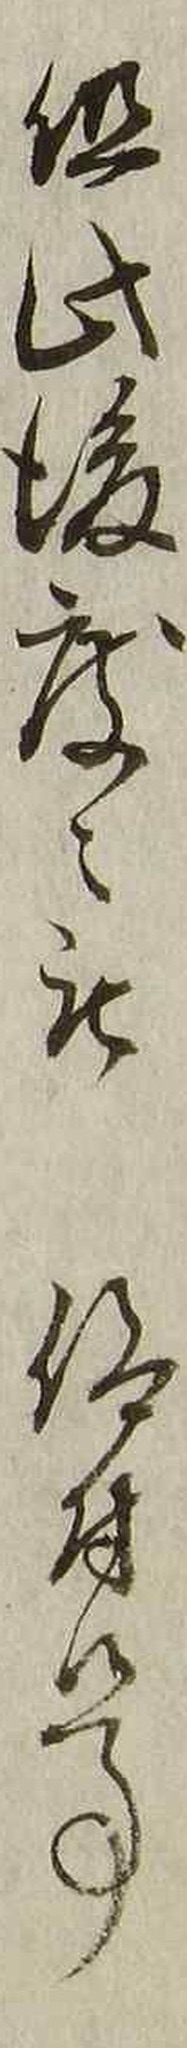但此後度々被仰付候事
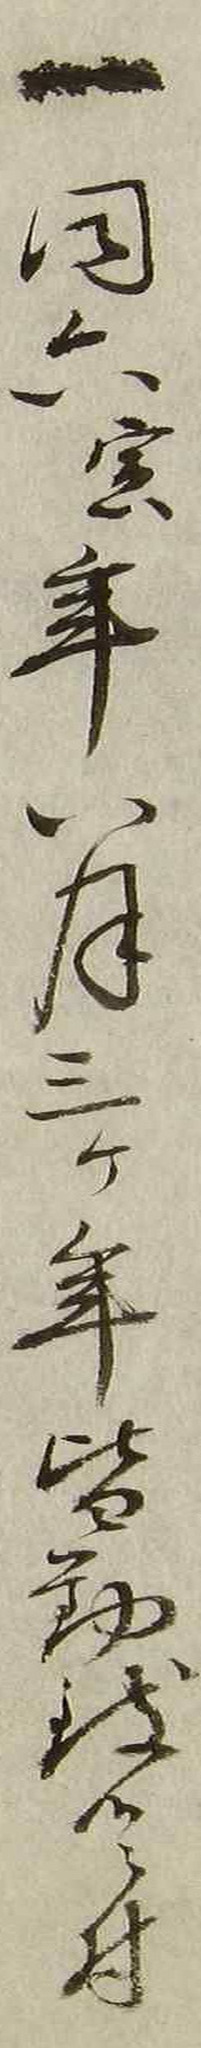一同六寅年八月三ヶ年皆勤致候ニ付
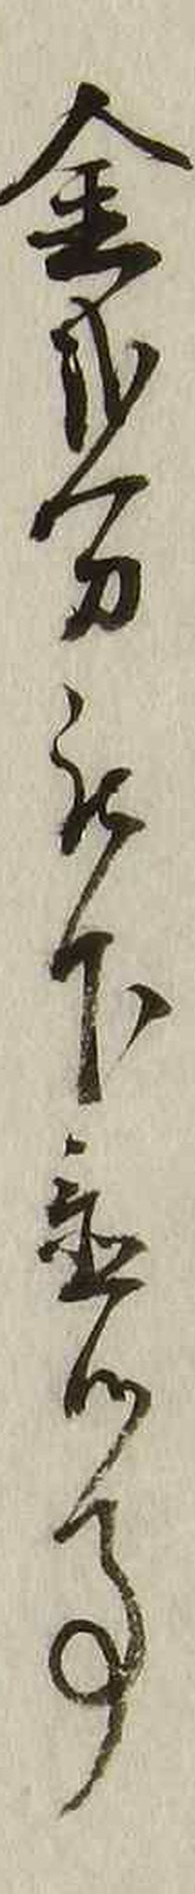金弐分被下置候事
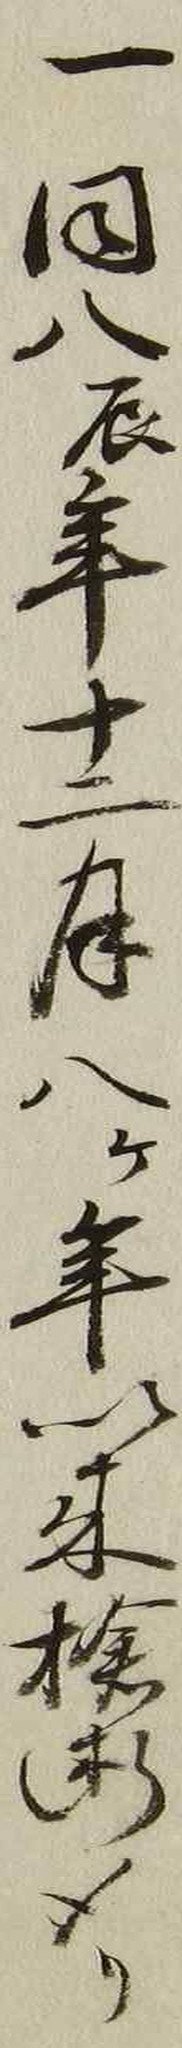一同八辰年十二月八ヶ年以来槍術〆り
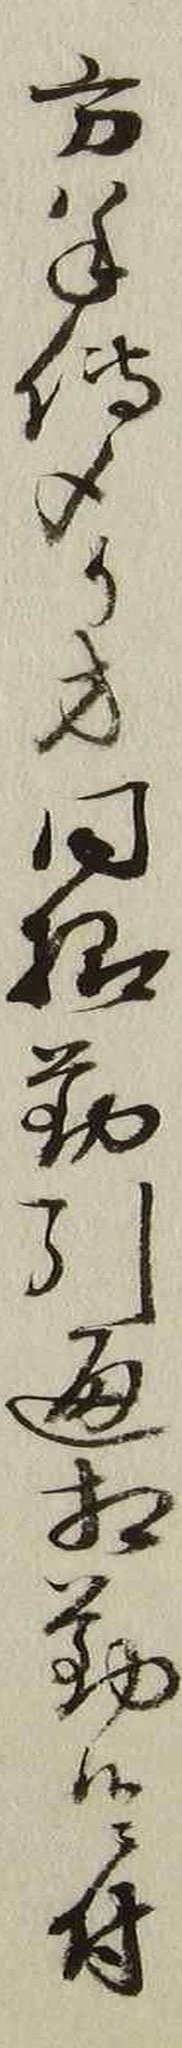方手伝〆り方同様勤引通相勤候ニ付
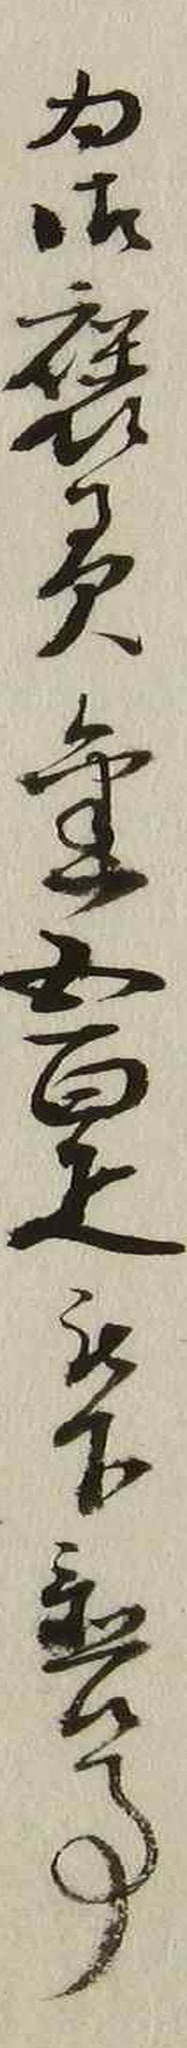為御褒美金五百疋被下置候事
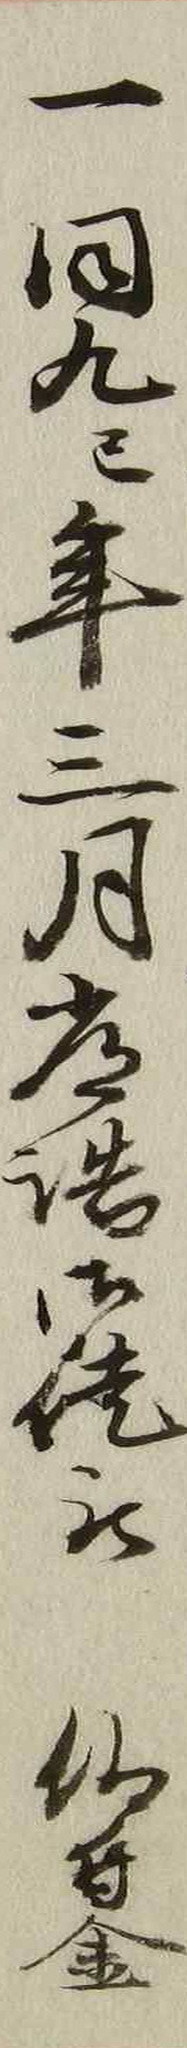一同九巳年三月常詰御徒被仰付金
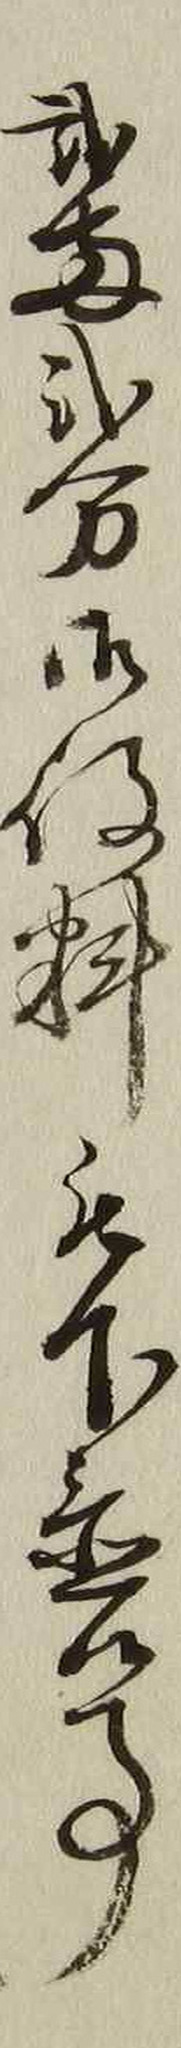弐両弐分御役料被下置候事
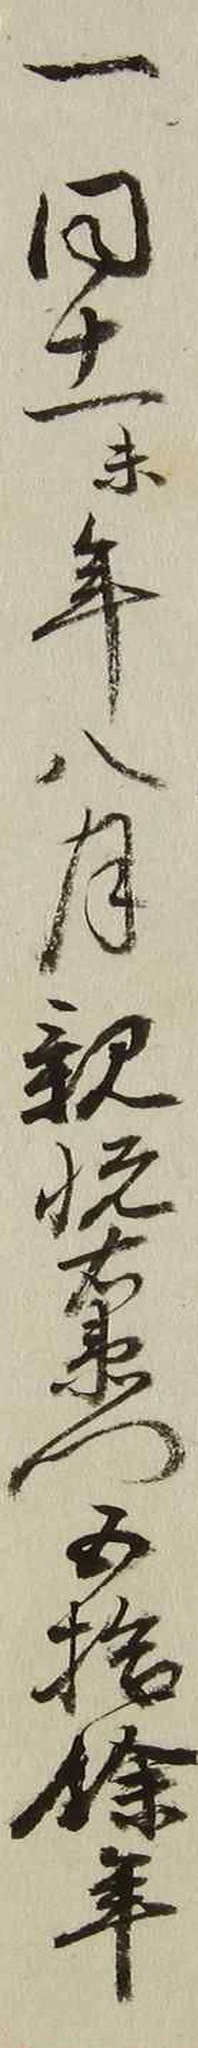一同十一未年八月親悦右衛門五拾余年
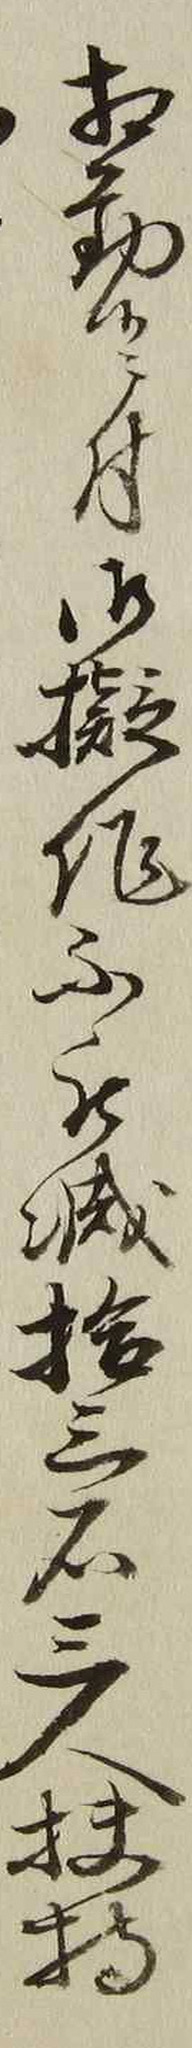相勤候ニ付御擬作不被減拾三石三人扶持
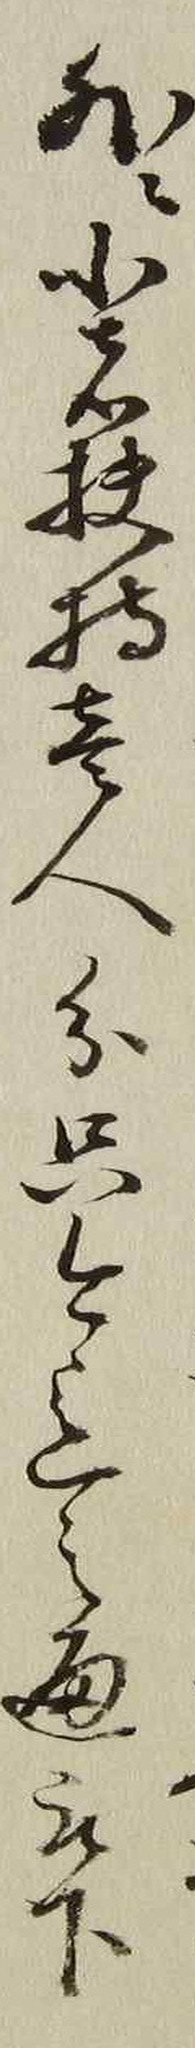外ニ小者扶持壱人分只今迄之通被下
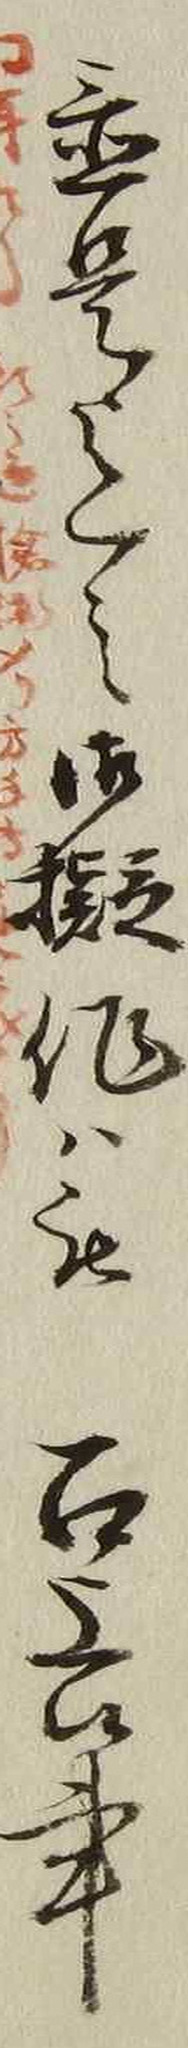置是迄之御擬作ハ被召上候事
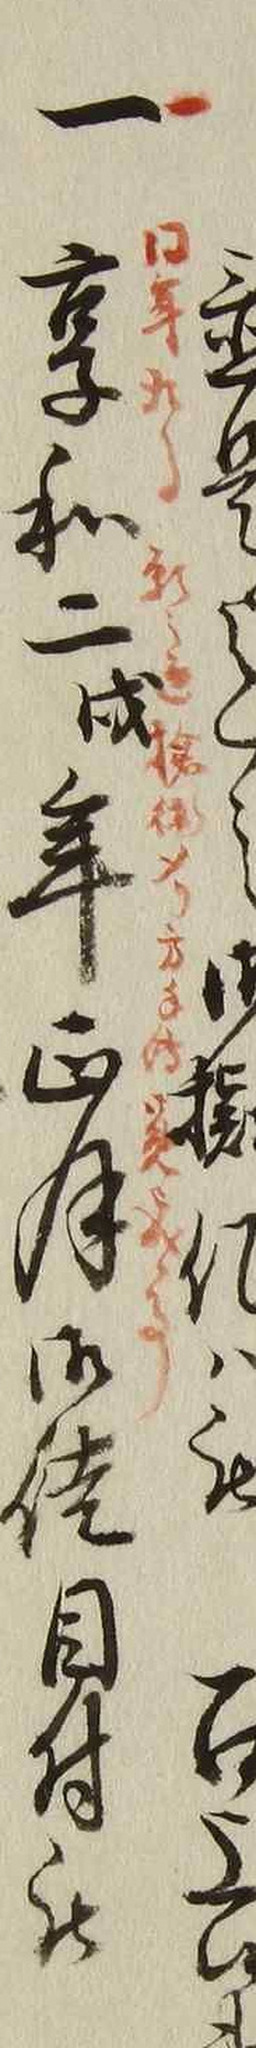一享和二戌年正月御徒目付被仰付
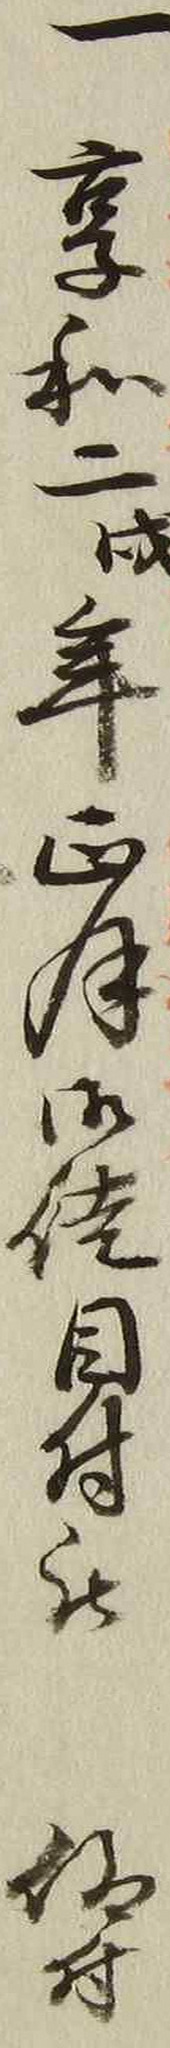一享和二戌年正月御徒目付被仰付
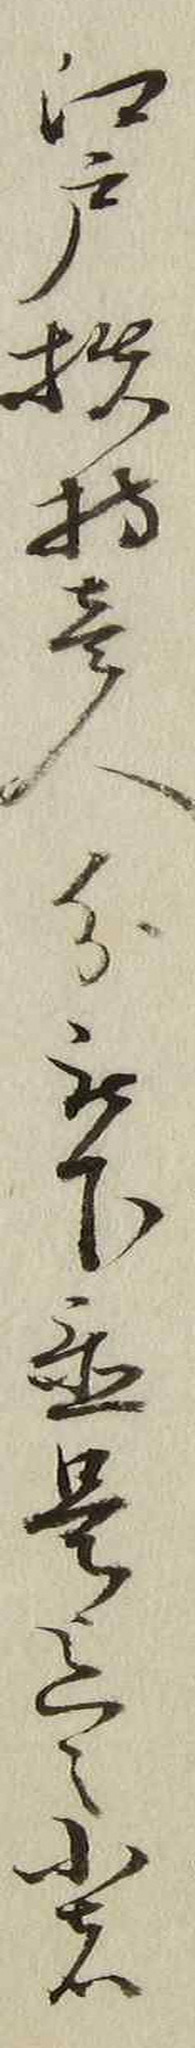江戸扶持壱人分被下置是迄之小者
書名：諸士系譜　巻之39　は之部7
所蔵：会津若松市立会津図書館
